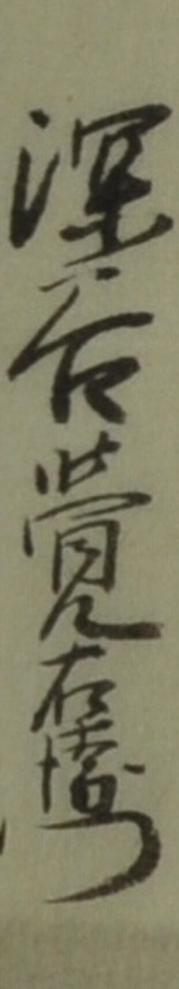深谷覚右衛門
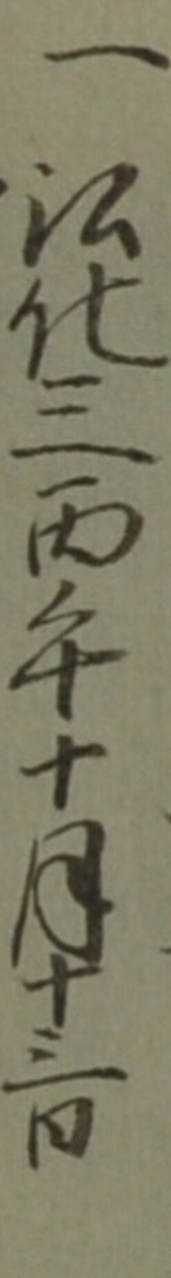一弘化三丙午十月十三日
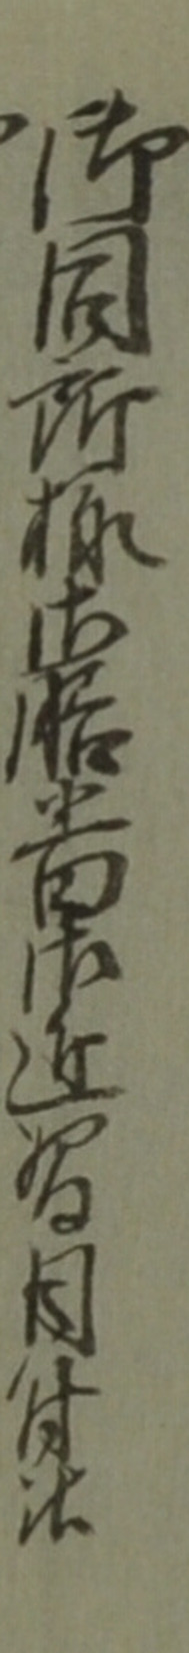御同所様御膳番御近習目付被
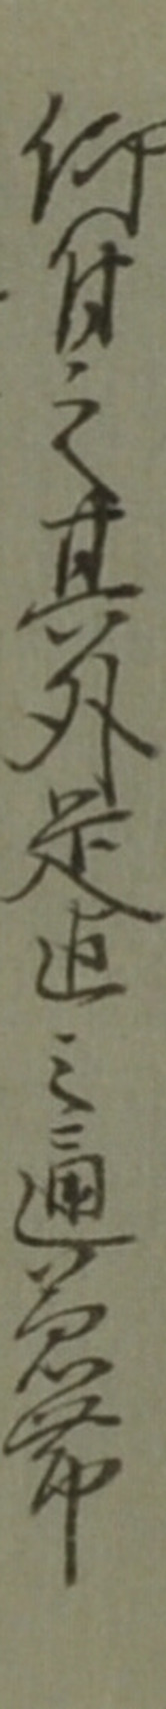仰付之其外是迄之通兼帯
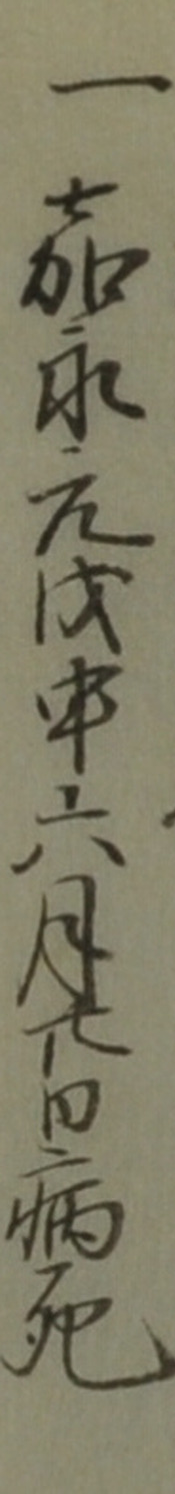一嘉永元戌申六月廿日病死
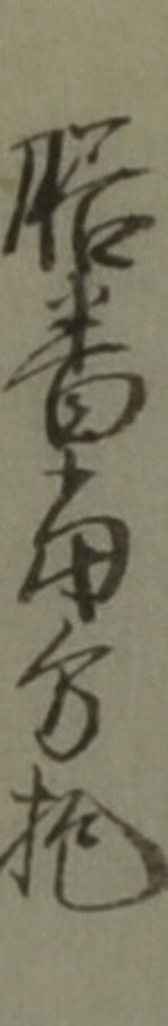膳番当分抱
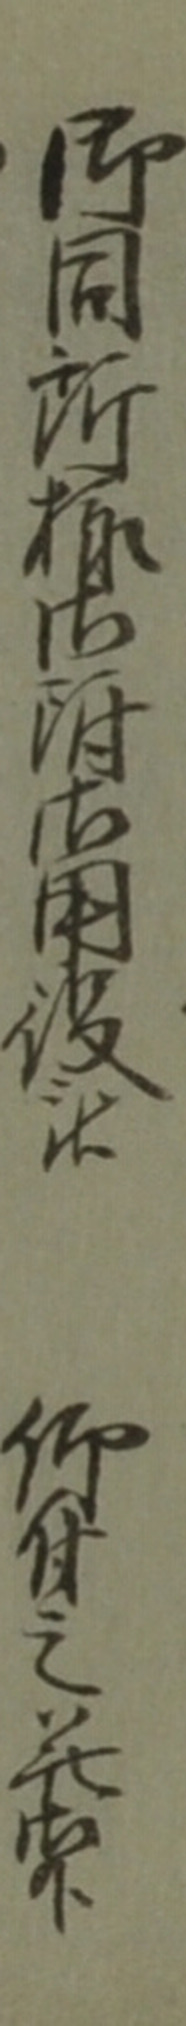御同所様御附御用役被仰付之并御下
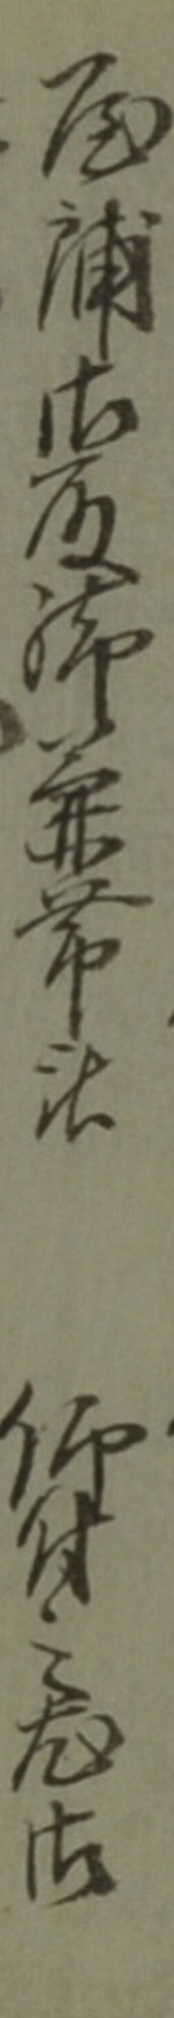屋敷御取締兼帯被仰付之尤御
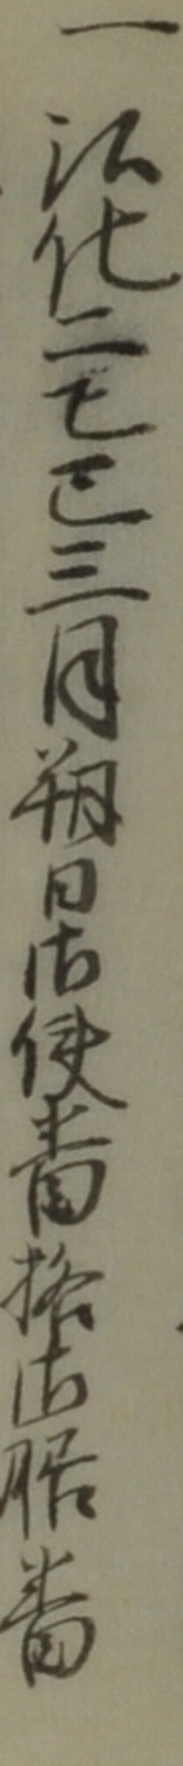一弘化二己巳三月朔日御使番格御膳番
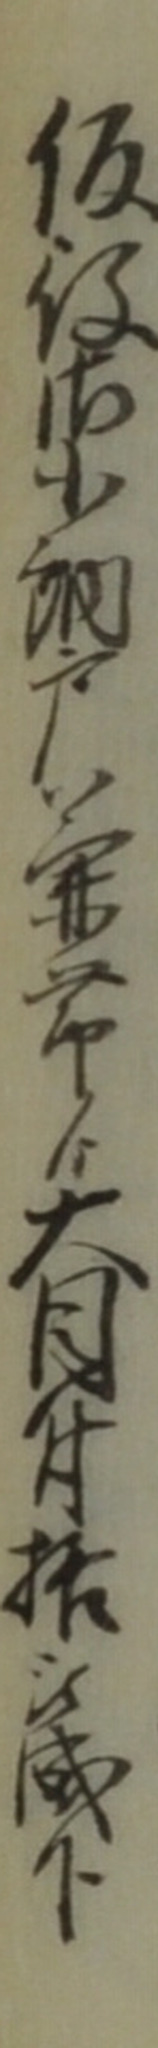仮役御小納戸兼帯ゟ大目付格被成下
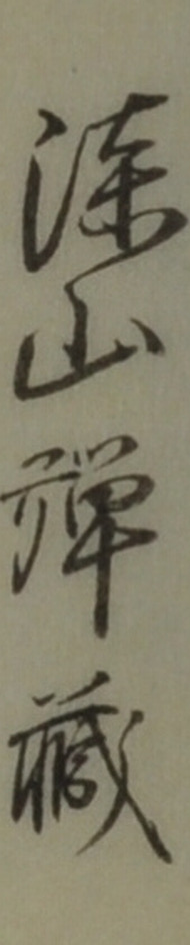漆山弾蔵
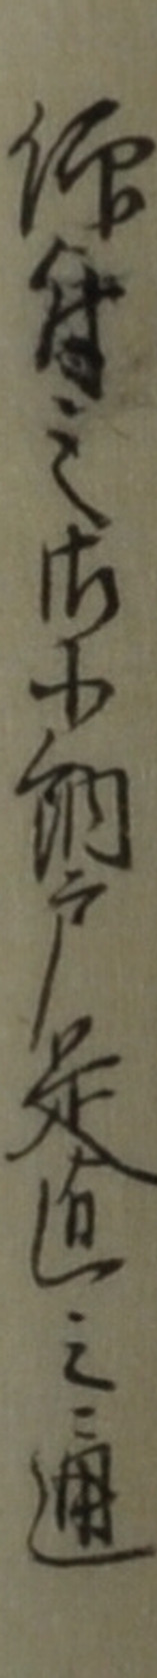仰付之御小納戸是迄之通
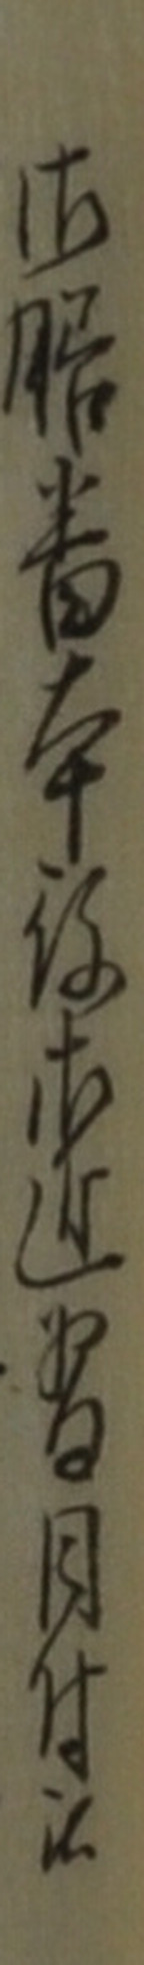御膳番本役御近習目付被
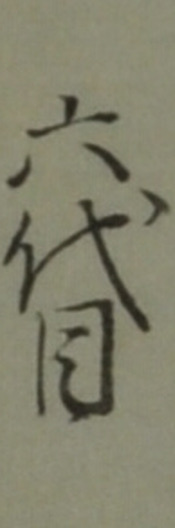六代目
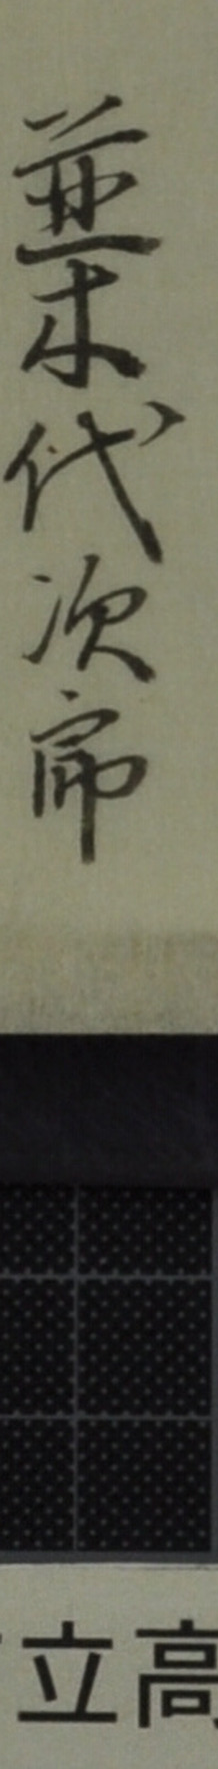並木代次郎
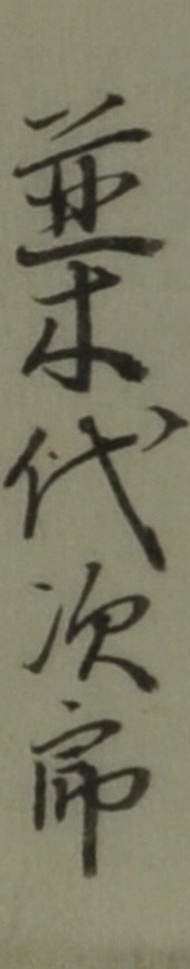並木代次郎
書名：諸御役代々録（四）
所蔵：伊那市立高遠町図書館・合同会社AMANE
